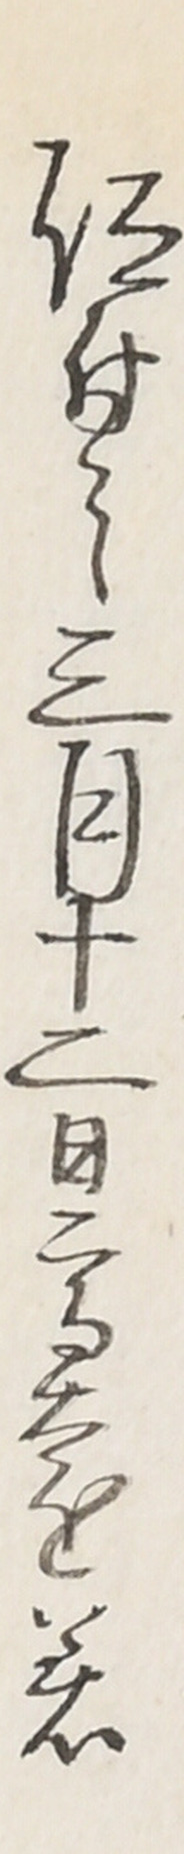仰付之三月十二日高遠着
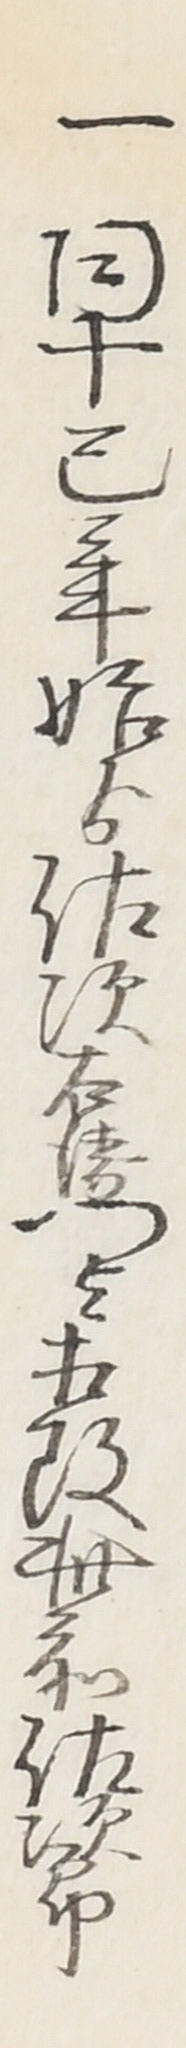一同十巳年始ゟ佐次右衛門と相改此前佐次郎
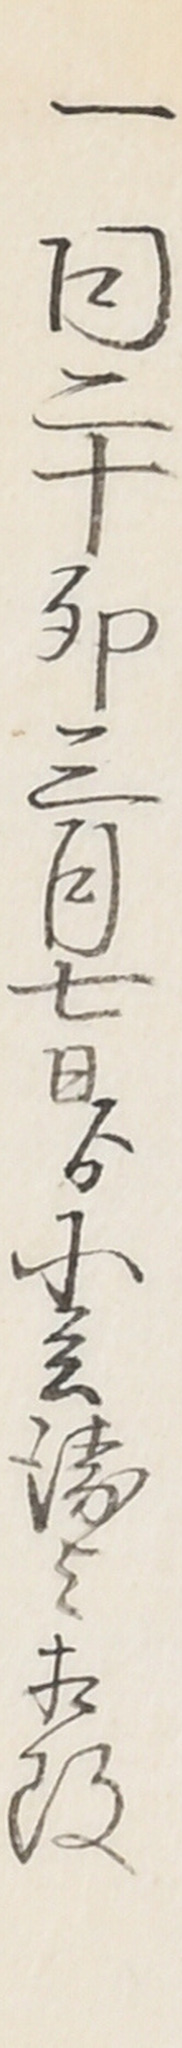一同二十卯三月七日ゟ小兵衛と相改
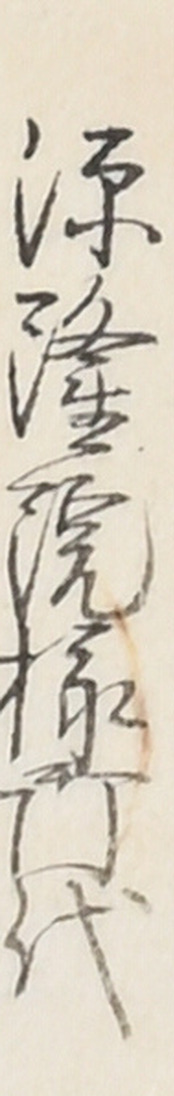源隆院様御代
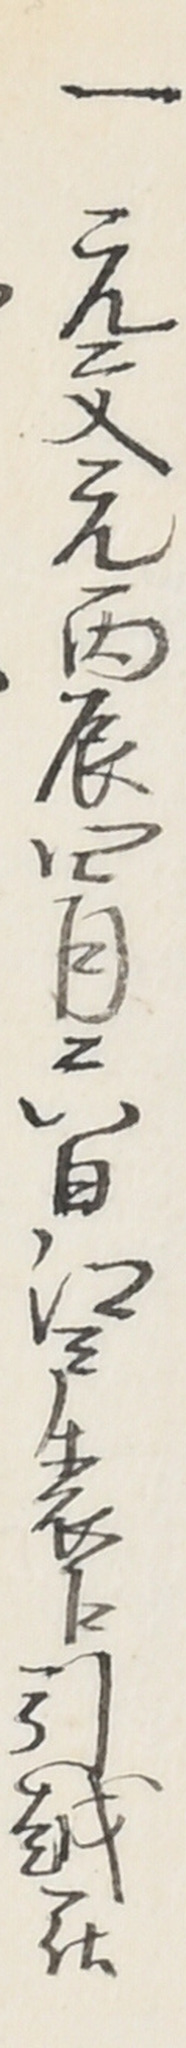一元文元丙辰四月六日江戸表江引越被
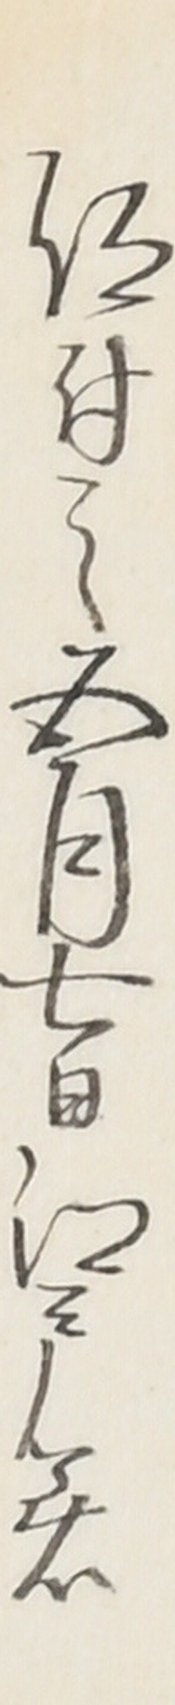仰付之五月七日江戸着
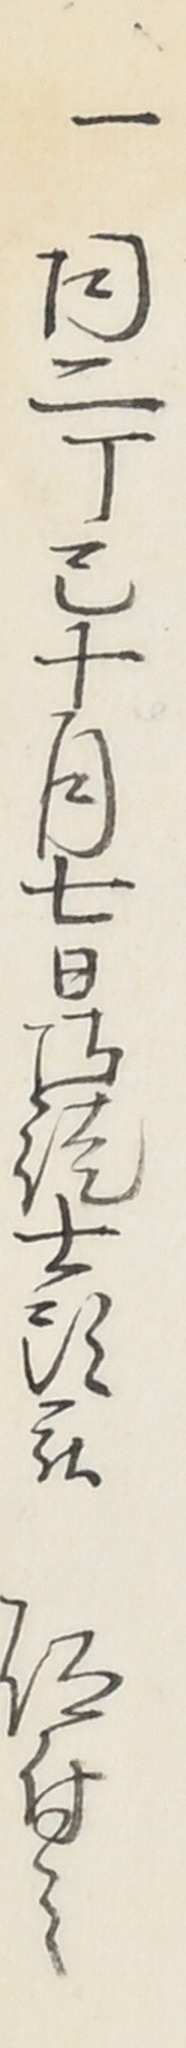一同二丁巳十月七日御徒士頭被仰付之
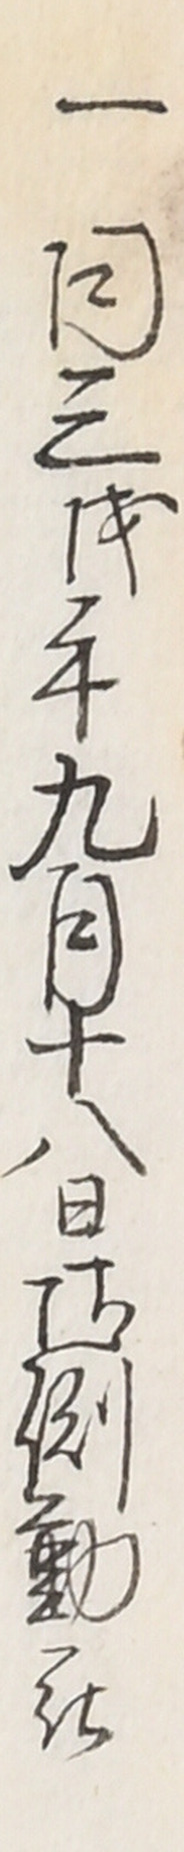一同三戊午九月十八日御側勤被
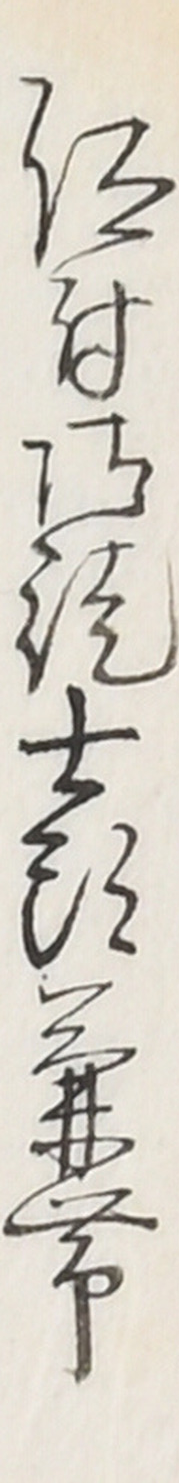仰付御徒士頭兼帯
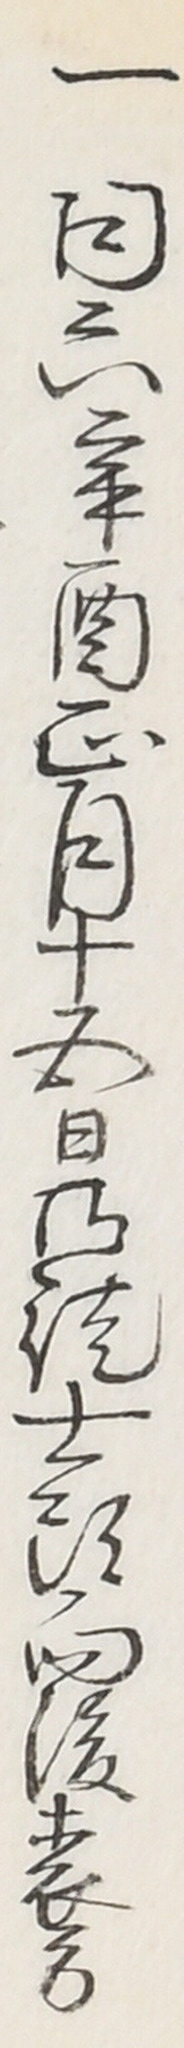一同六辛酉正月十五日御徒士頭向後表方
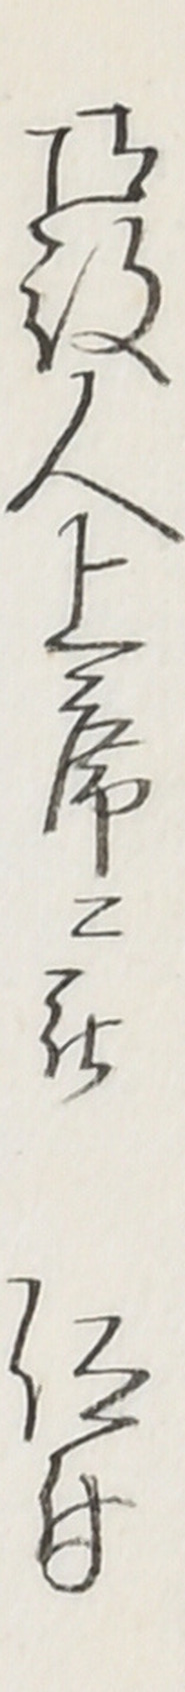御役人上席ニ被仰付
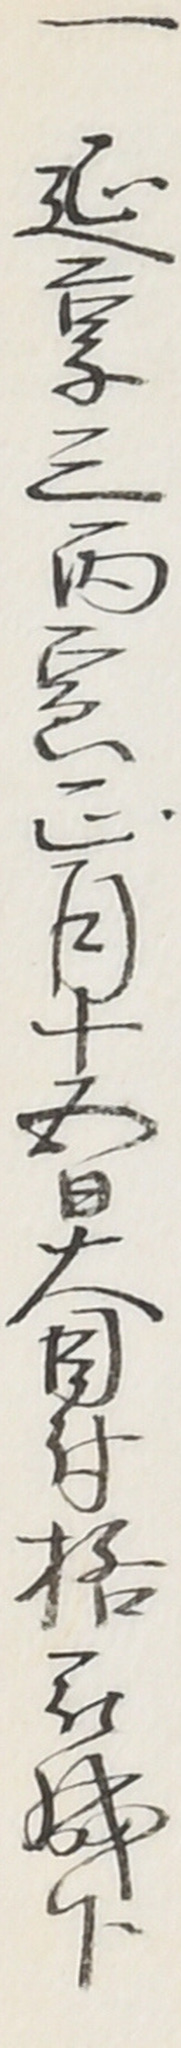一延享三丙寅正月十五日大目付格被成下
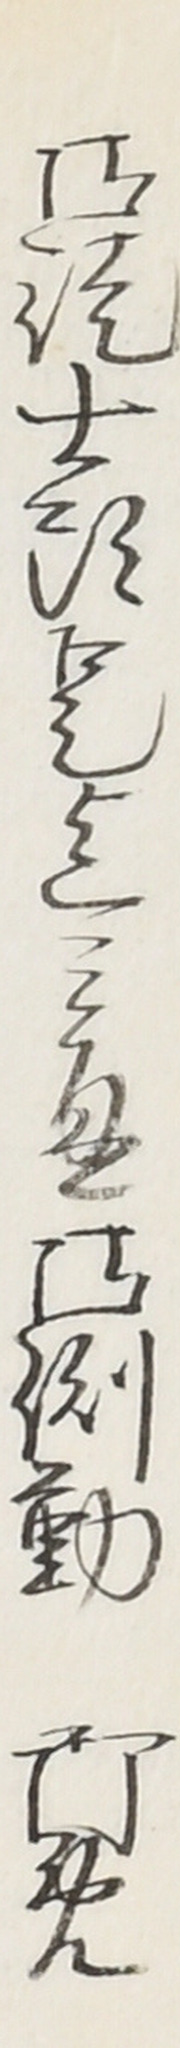御徒士頭是迄之通御側勤御免
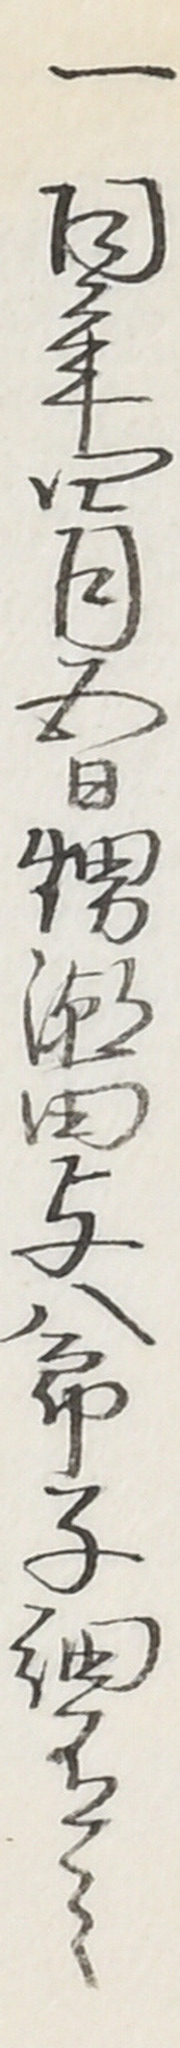一同年四月五日甥潮田与八郎子細有之
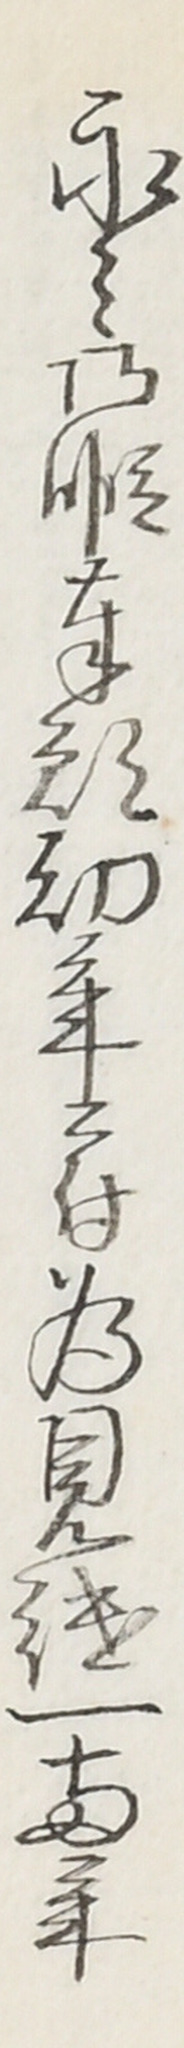永之御暇奉願幼年ニ付為見継一両年
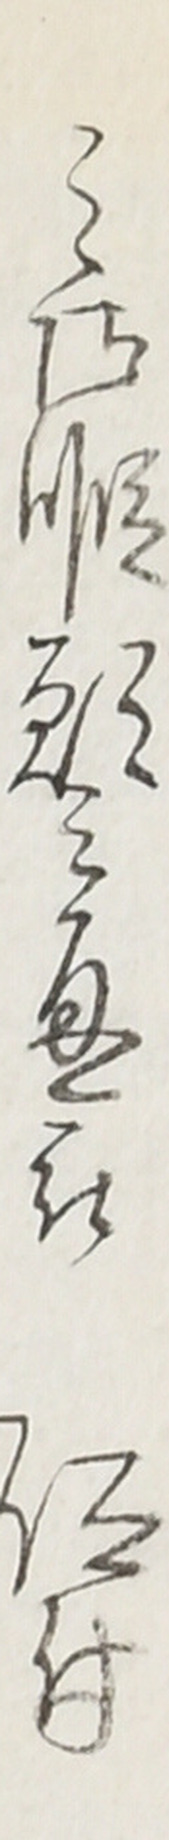之御暇願之通被仰付
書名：給人諸士勤仕録（七）
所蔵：伊那市立高遠町図書館・合同会社AMANE
